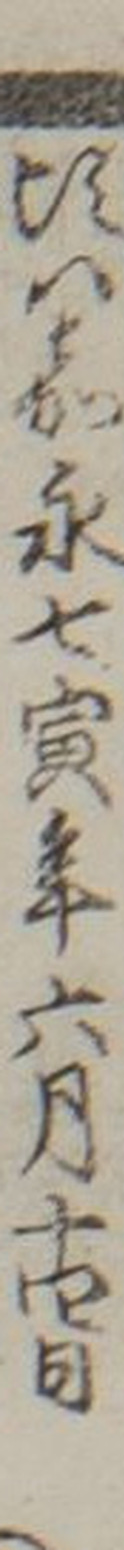頃は嘉永七寅年六月十四日
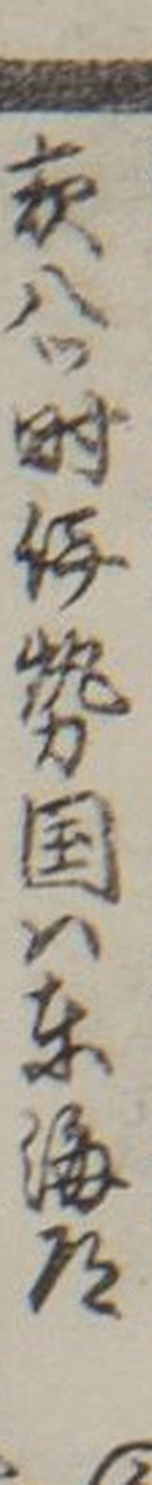夜八ツ時伊勢国は東海道
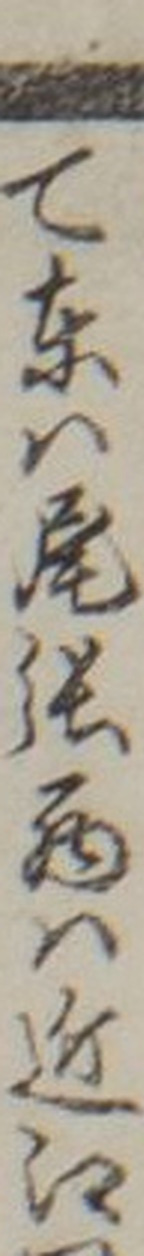て東は尾張西は近江国
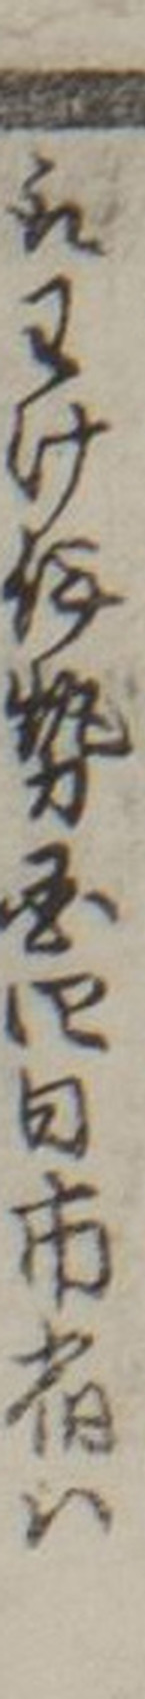取わけ伊勢国四日市宿は
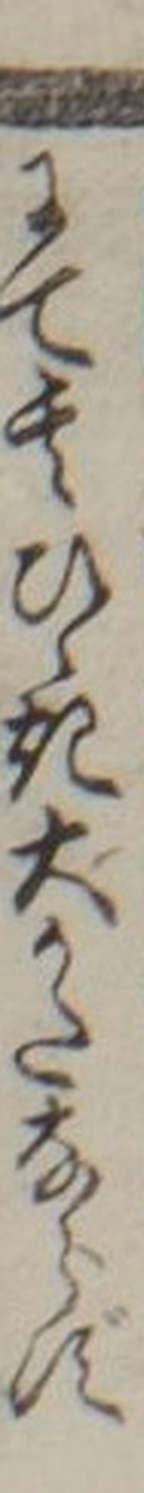にて其ひゝき大かたならず
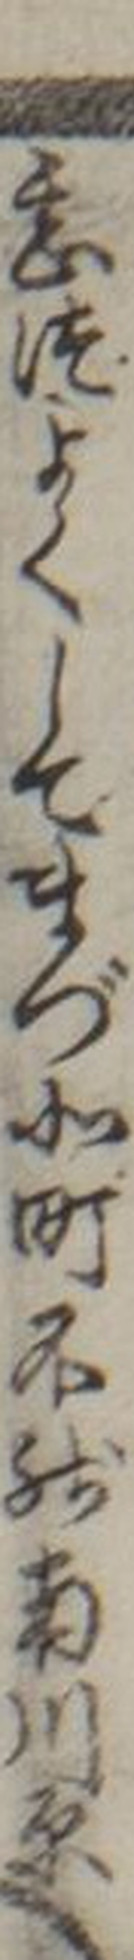甚つよくしてまづ北町不残南川原
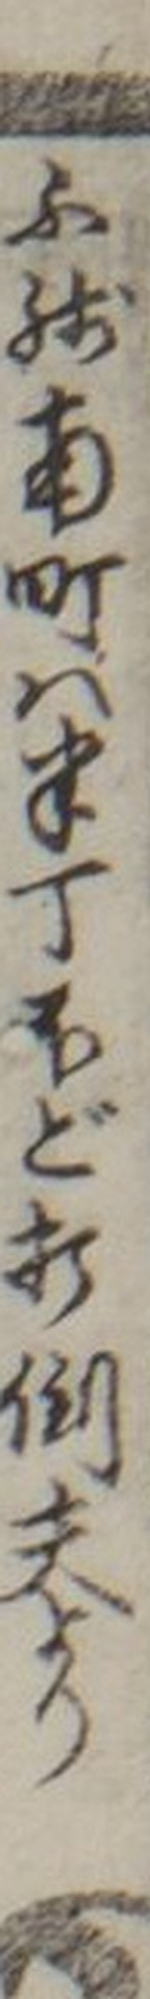不残南町は半丁ほど打倒夫より
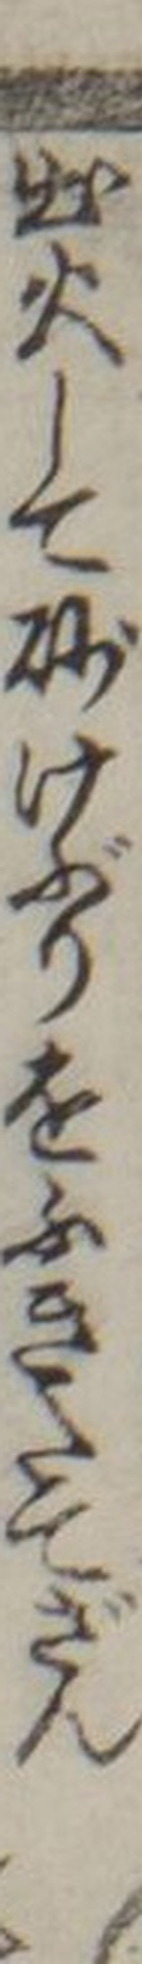出火して砂けぶりをふきたてざん
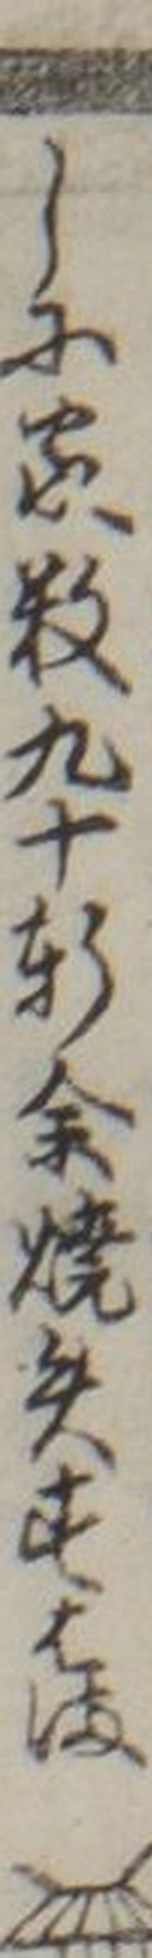しに家数九十軒余焼失すはま
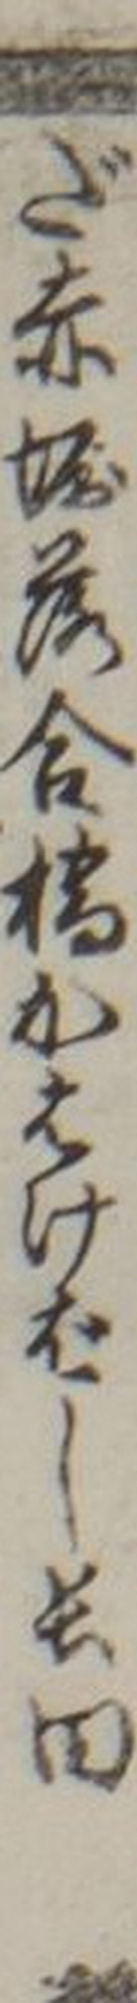だ赤堀落合橋かはけばし長田
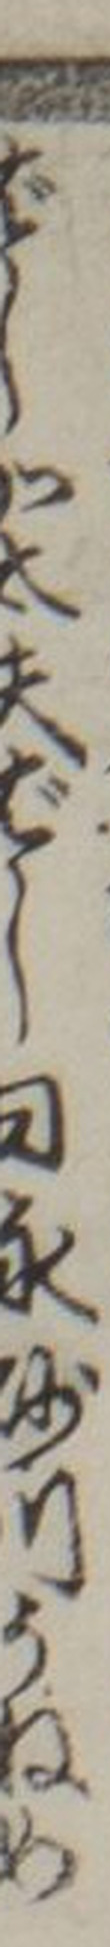ばし加太夫ばし日永砂川うねめ
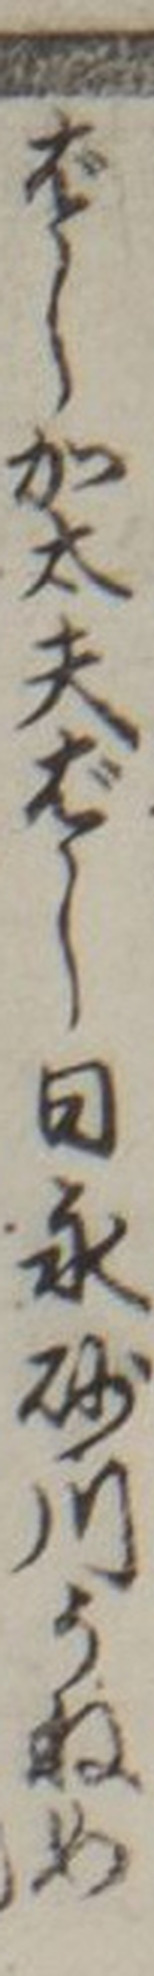ばし加太夫ばし日永砂川うねめ
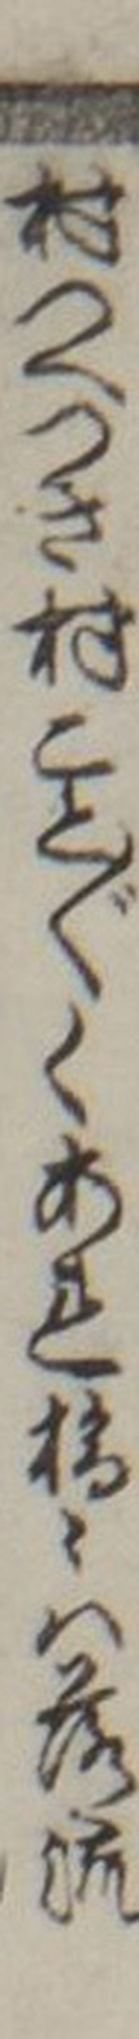村つへつき村こと〴〵くあれ橋々は落流
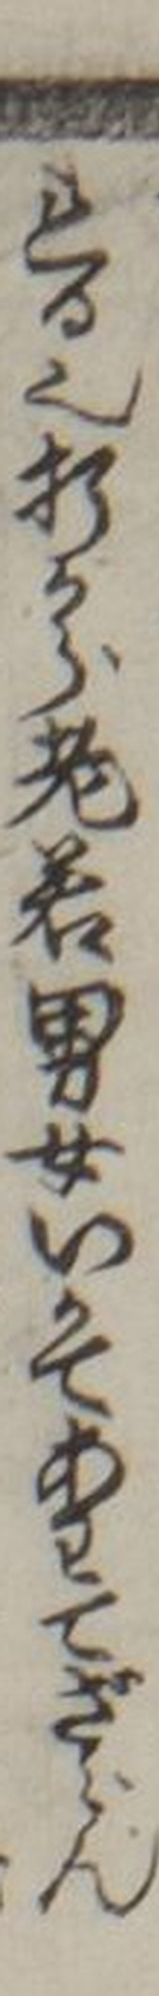れる也折から老若男女いかてあわてざらん
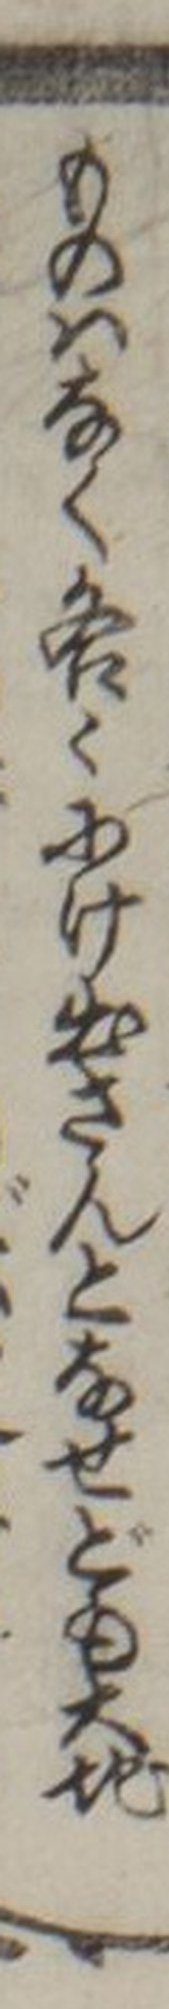ものはなく各々にけ出さんとなせども大地
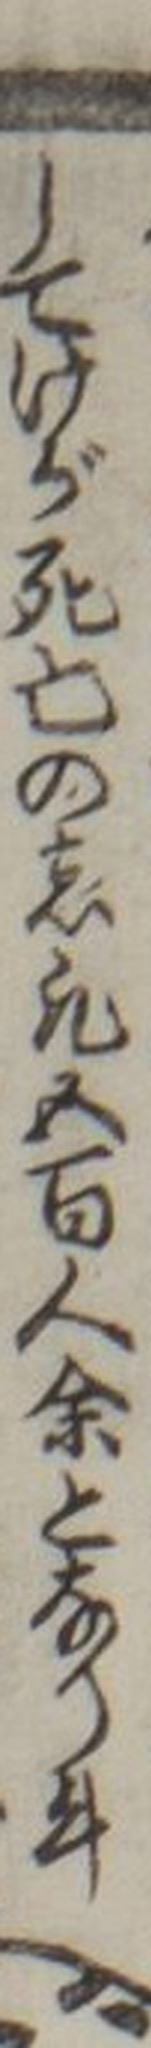してけが死亡の者凡五百人余となり牛
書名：伊勢伊賀志摩近江尾張美濃大地震の図
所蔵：あいおいニッセイ同和損保株式会社
